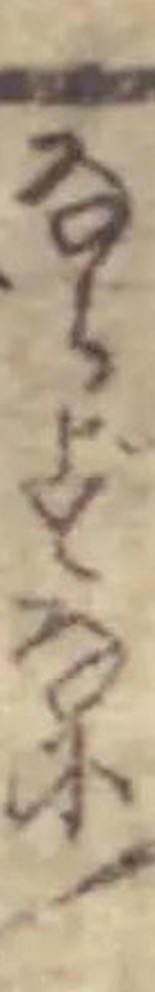ならずなに
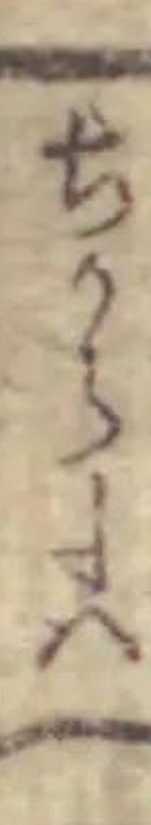ちからには
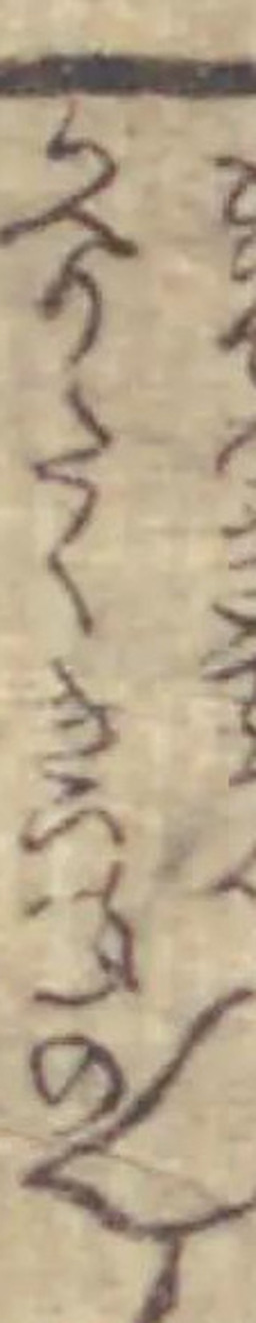かへりたくきつねの
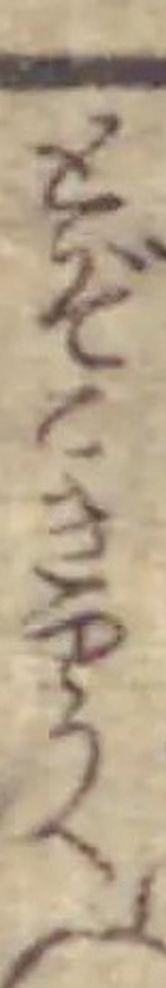とぞこきやうへ
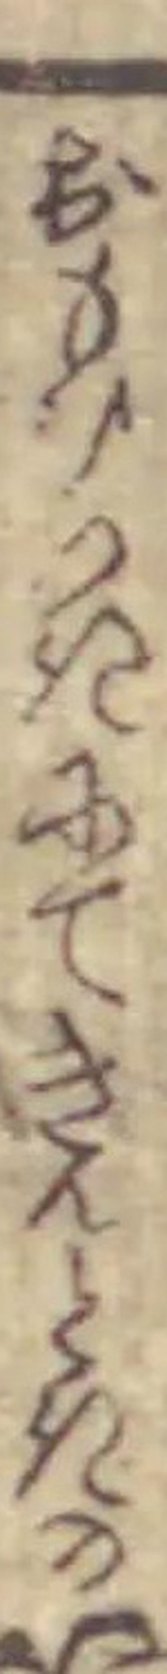おもひつきにてきんときの
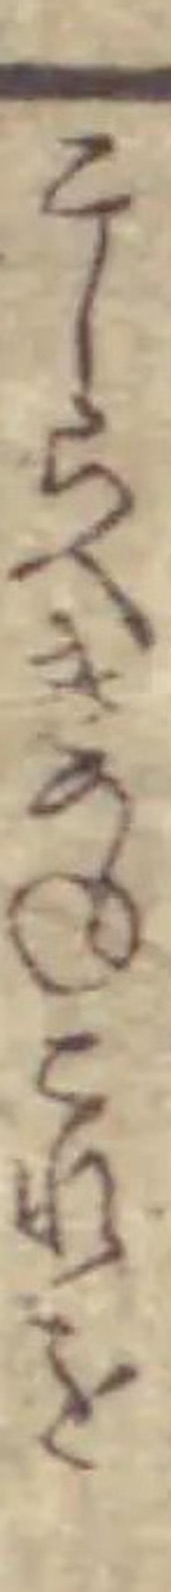こしらへきつねこれを
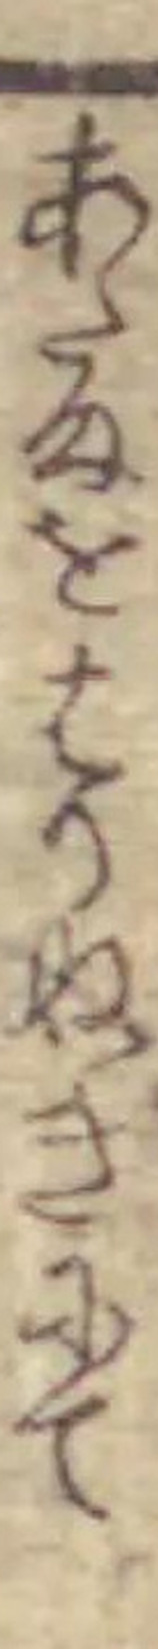あたまをはりぬきにて
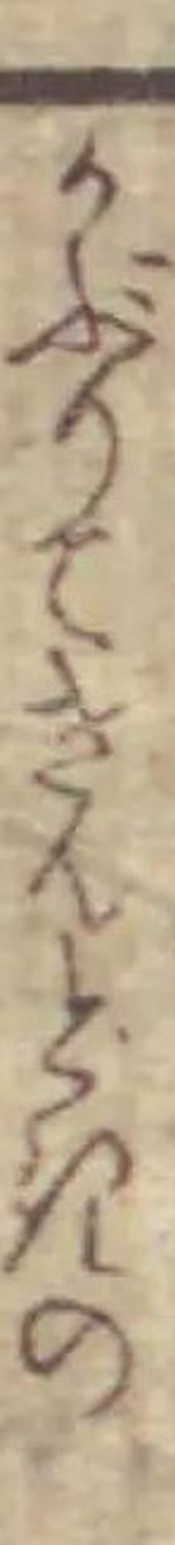かぶりてきんときの
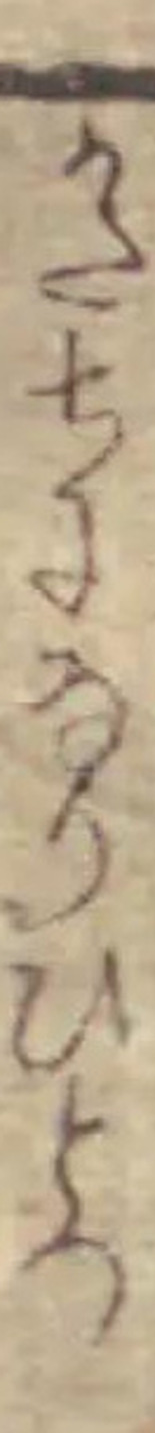かたちになりひとつ
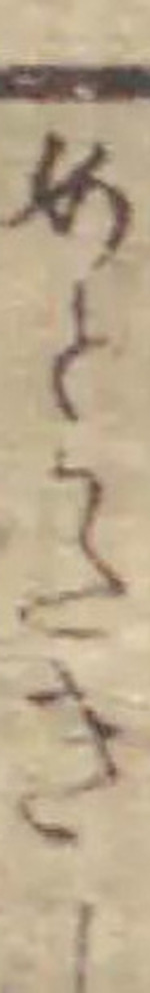めとかたき
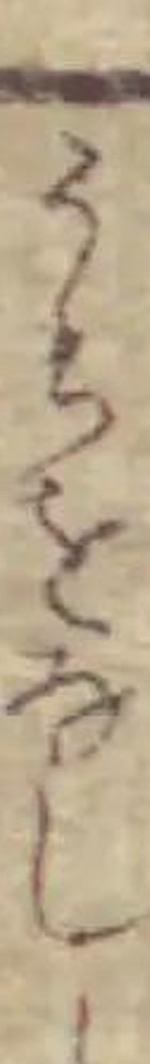うちをなし
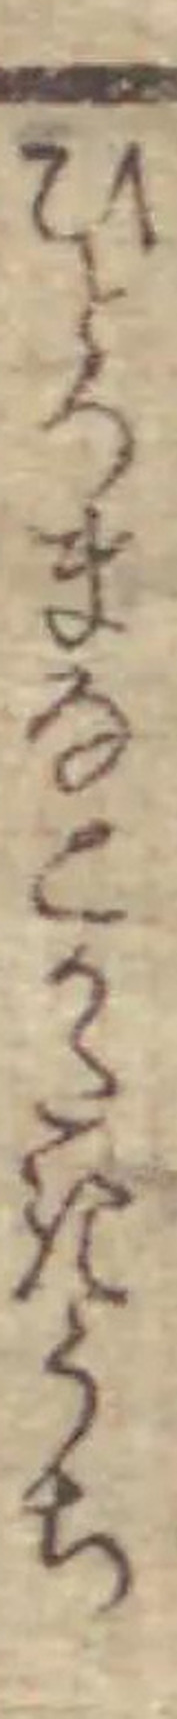ひとつまなこかたきうち
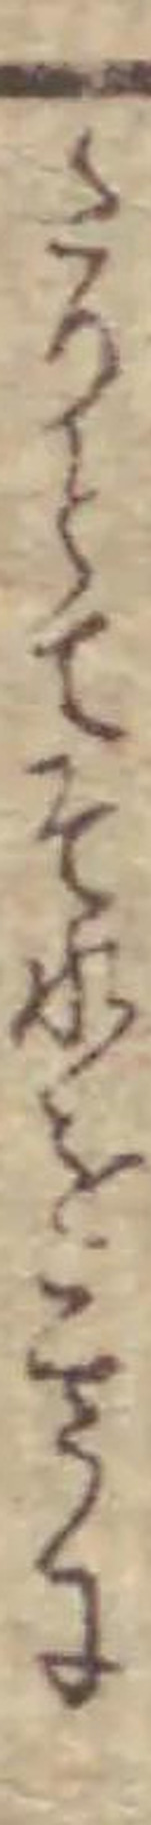たりとてそれをこうに
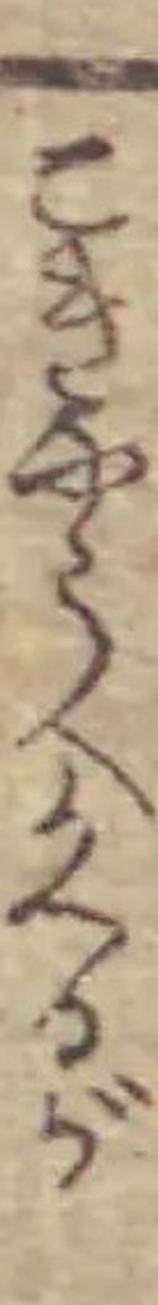こきやうへかへるが
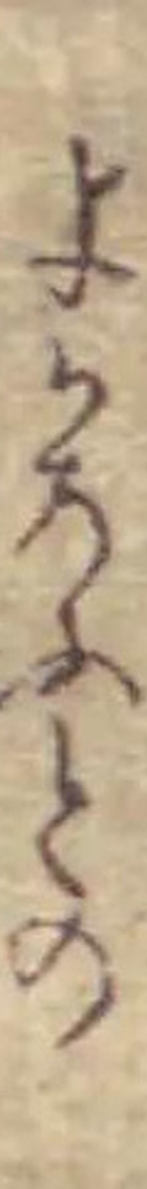よかろふとの
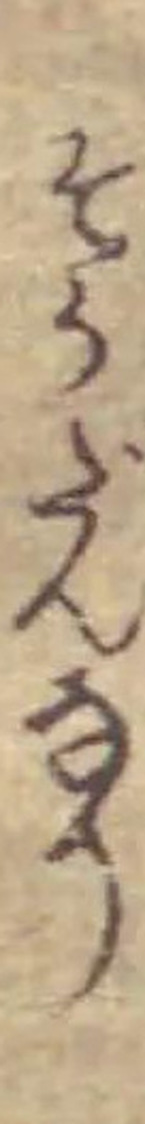そうだんなり
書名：化物敵討 2巻
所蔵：国立国会図書館 National Diet Library, JAPAN
